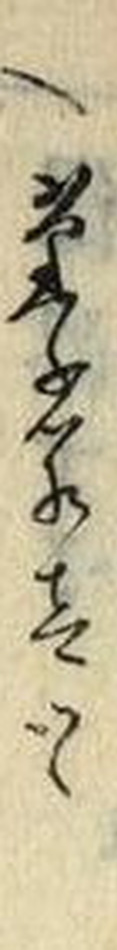菓子箱壱ツヽ

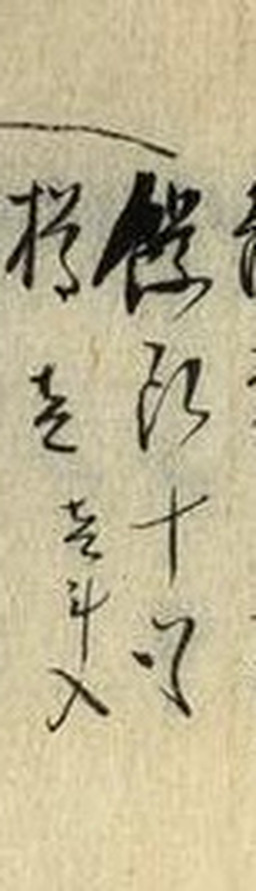樽壱壱斗入
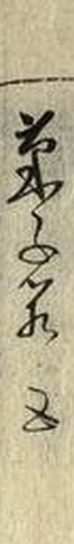菓子箱五
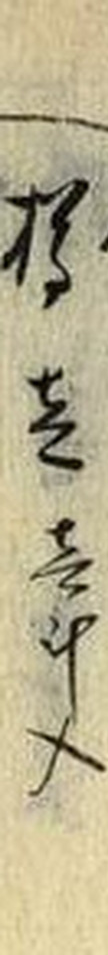樽壱壱斗入
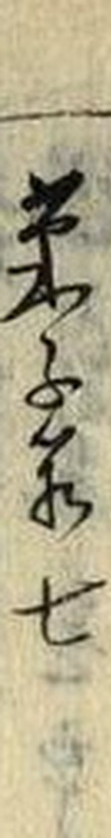菓子箱七
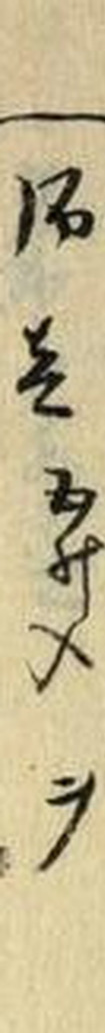酒壱五升入
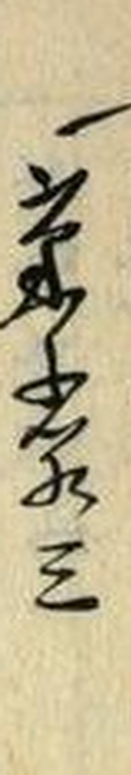菓子箱五
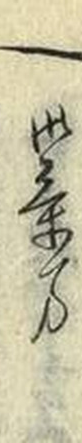御茶方
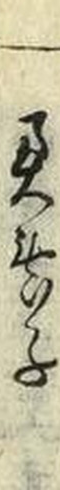奥台子
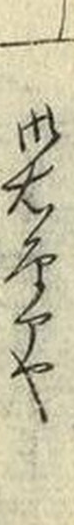御右筆部や
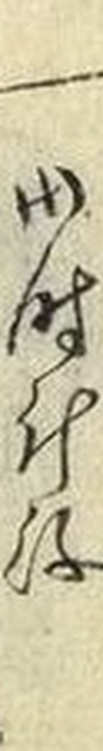御時計役
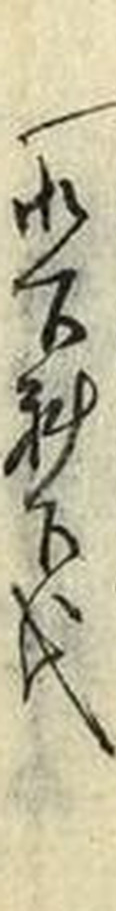御召料下代
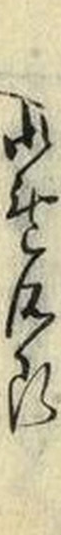御台所頭
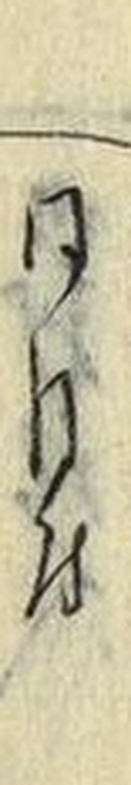同目付

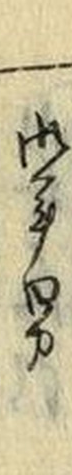御年男
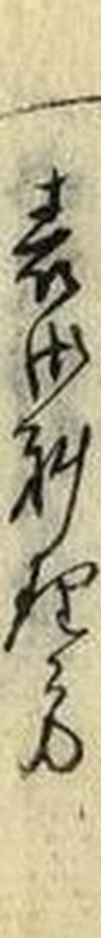表御料理方
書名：少傅日録抄（斉承付側向頭取日記、在国）
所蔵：福井県文書館 Fukui Prefectural Archives
